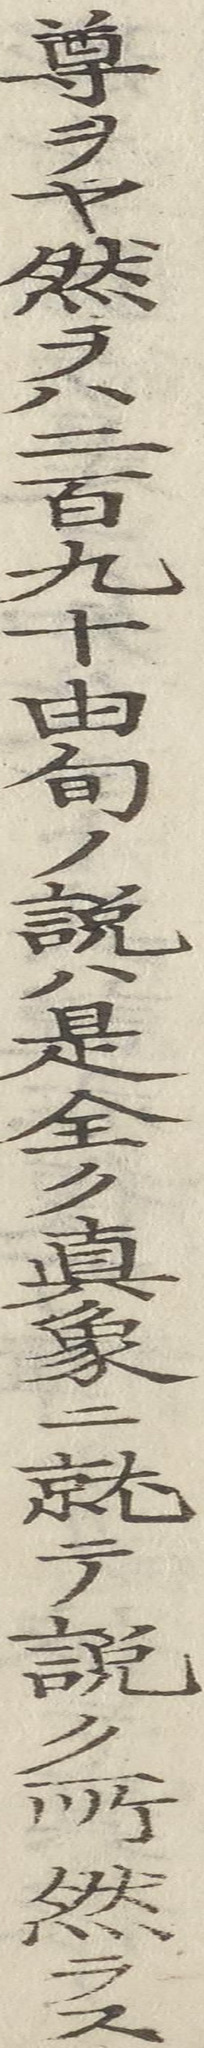尊ヲヤ然ラハ二百九十由旬ノ説ハ是全ク真象ニ就テ説ク所然ラス
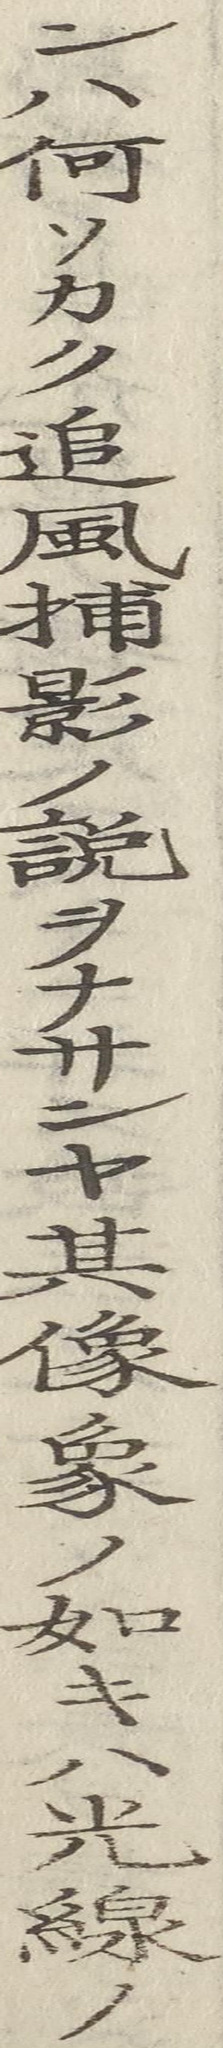ンハ何ソカク追風捕影ノ説ヲナサンヤ其像象ノ如キハ光線ノ

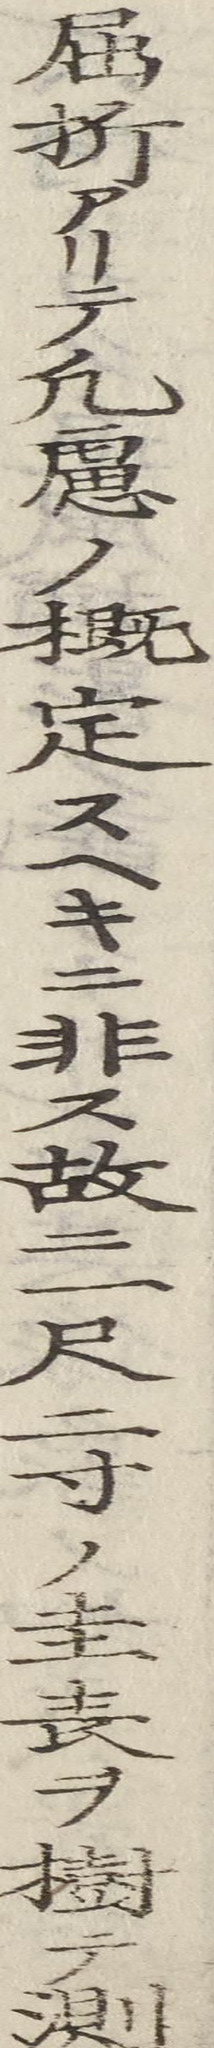屈折アリテ凡慮ノ概定スヘキニ非ス故ニ一尺二寸ノ圭表ヲ樹テ測
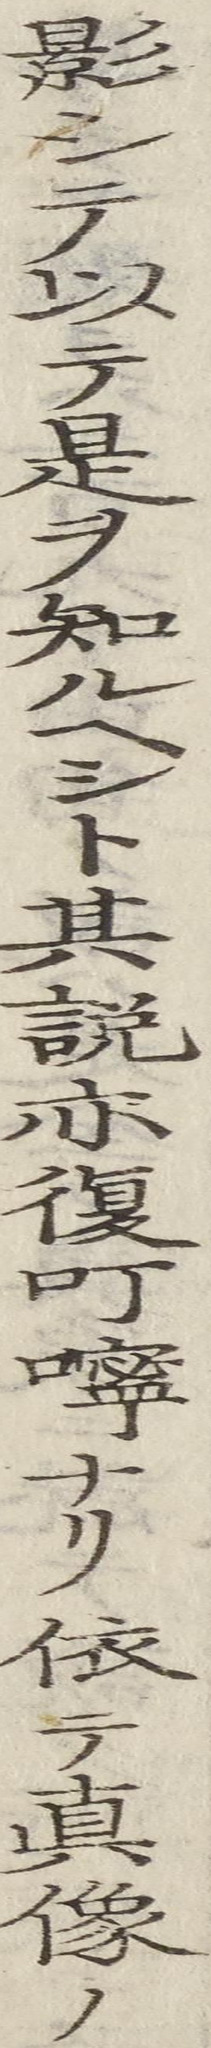影シテ以テ是ヲ知ルヘシト其説亦復叮嚀ナリ依テ真像ノ
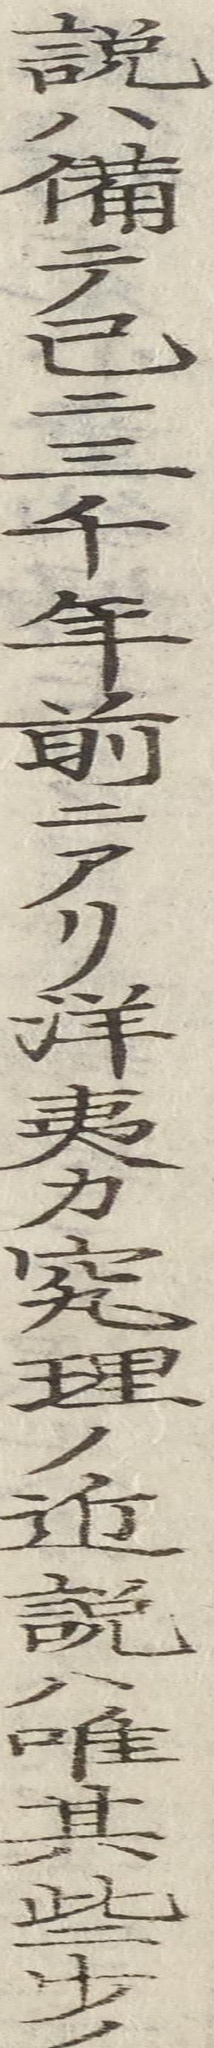説ハ備テ已ニ三千年前ニアリ洋夷カ究理ノ近説ハ唯其些少ノ
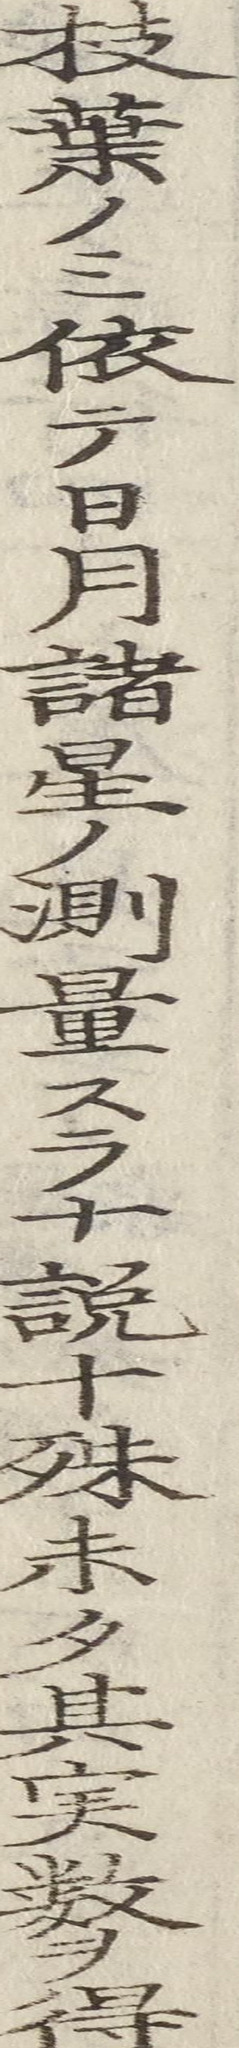枝葉ノミ依テ日月諸星ノ測量スラ十説十殊未タ其実数ヲ得
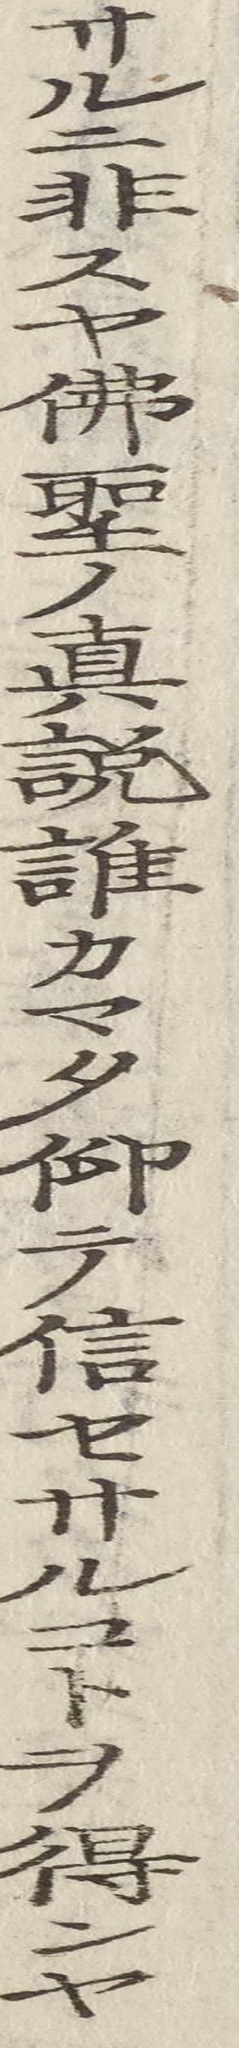サルニ非スヤ仏聖ノ真説誰カマタ仰テ信セサルコトヲ得ンヤ
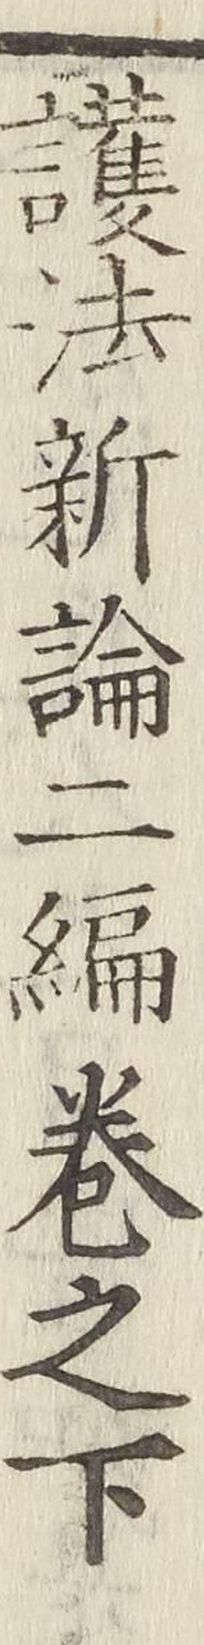護法新論ニ編巻之下
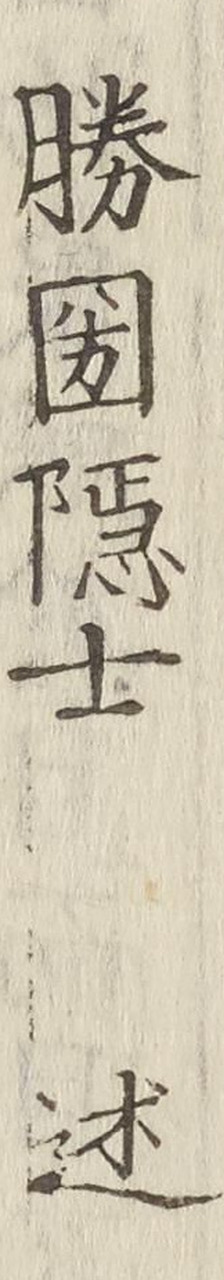勝国隠士述
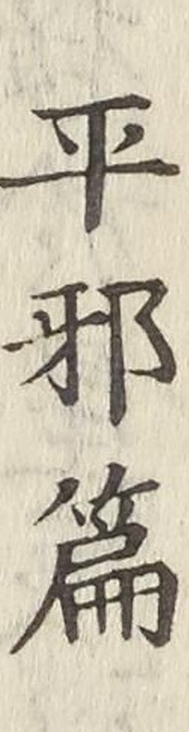平邪篇
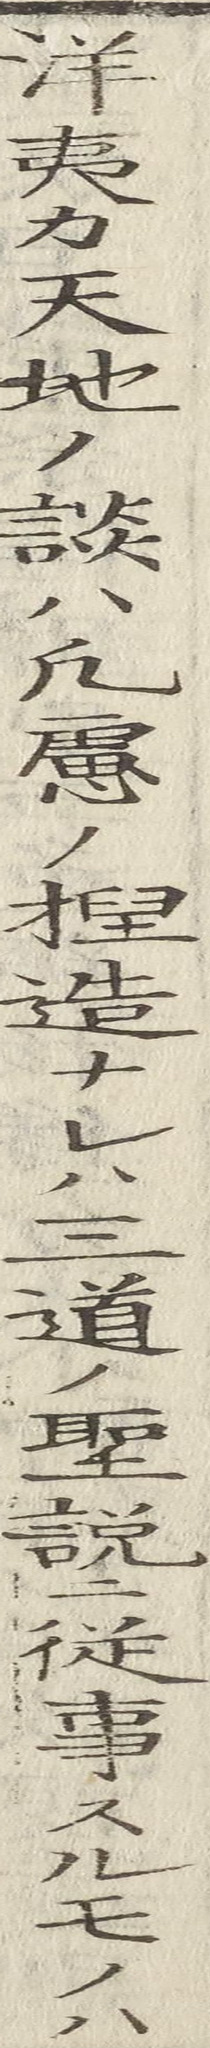洋夷カ天地ノ談ハ凡慮ノ捏造ナレハ三道ノ聖説ニ従事スルモノハ
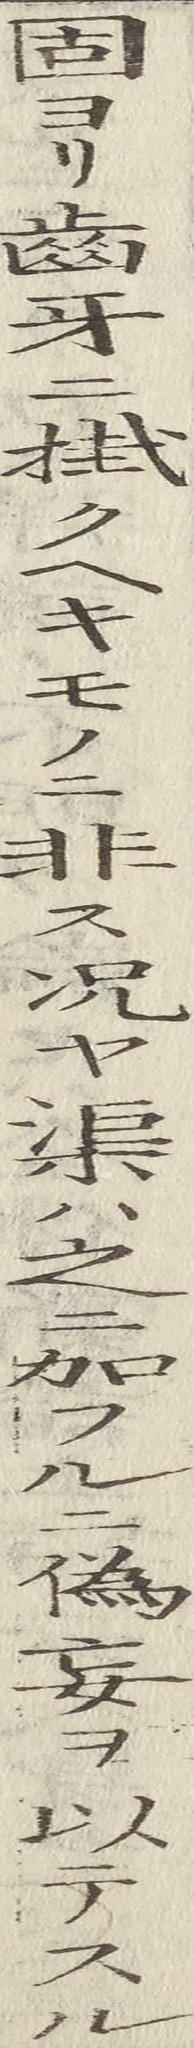固ヨリ歯牙ニ掛クヘキモノニ非ス況ヤ渠ハ之ニ加フルニ偽妄ヲ以テスル
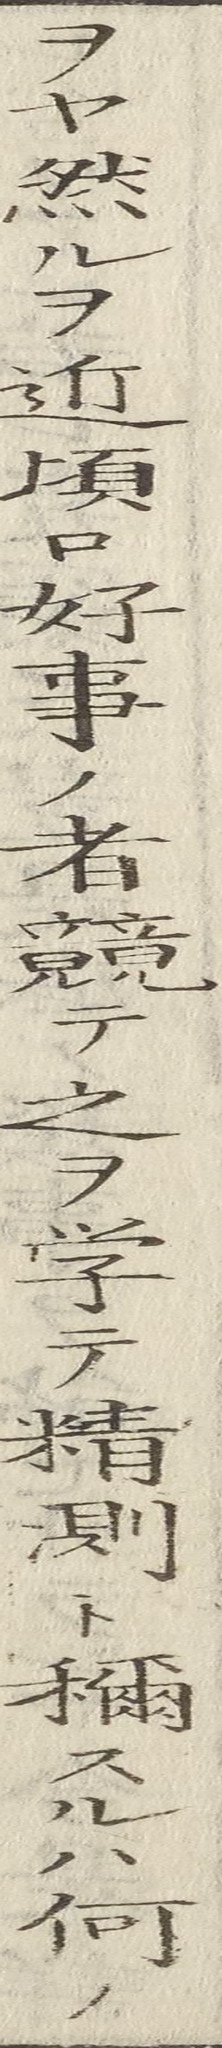ヲヤ然ルヲ近頃ロ好事ノ者競テ之ヲ学テ精測ト称スルハ何ノ
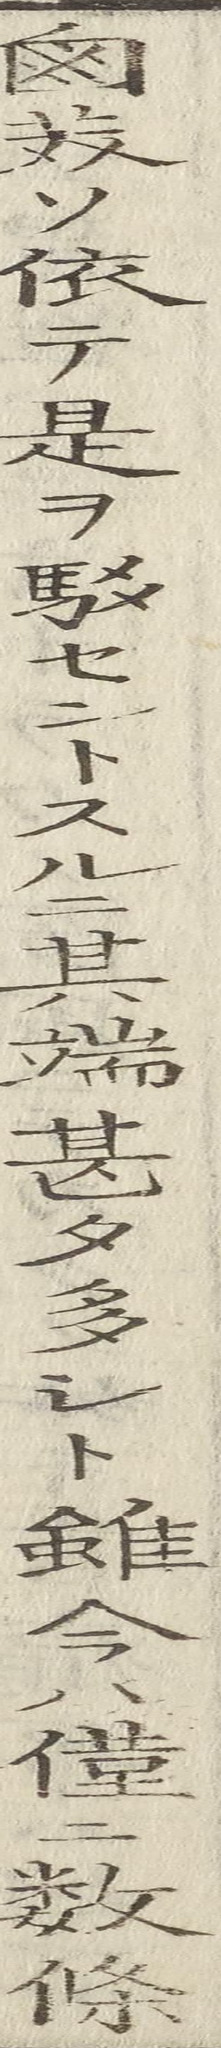鹵莽ソ依テ是ヲ駁セントスルニ其端甚タ多シト雖今ハ僅ニ数条
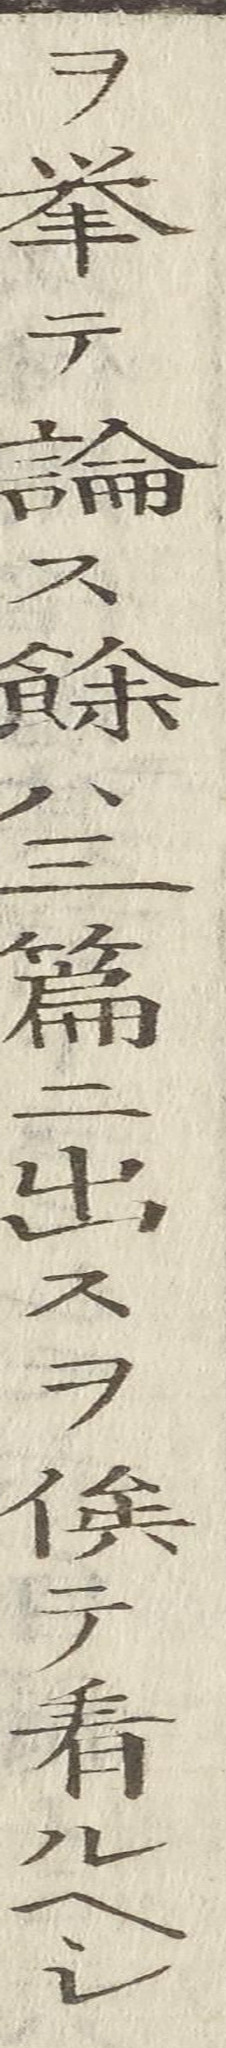ヲ挙テ論ス余ハ三篇ニ出スヲ俟テ看ルヘシ
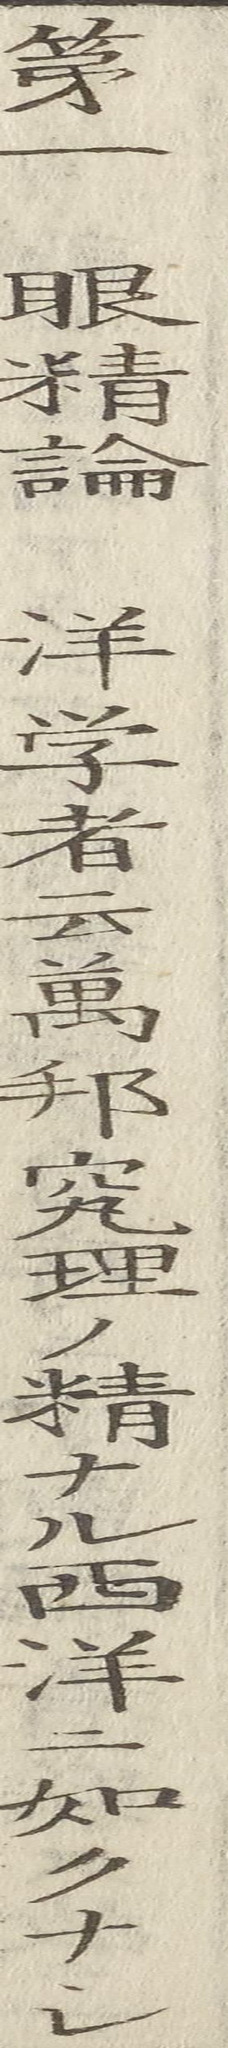第一眼精論洋学者云万邦究理ノ精ナル西洋ニ如クナシ
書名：護法新論　二編　下
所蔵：東京大学地震研究所図書室 Earthquake Research Institute Library, The University of Tokyo, JAPAN
